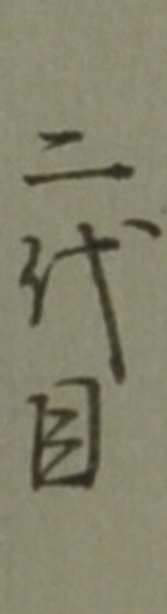二代目
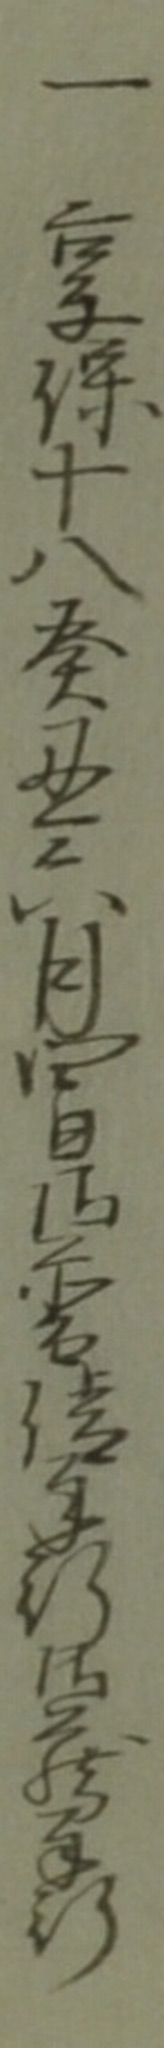一享保十八癸丑六月四日御普請奉行御蔵奉行
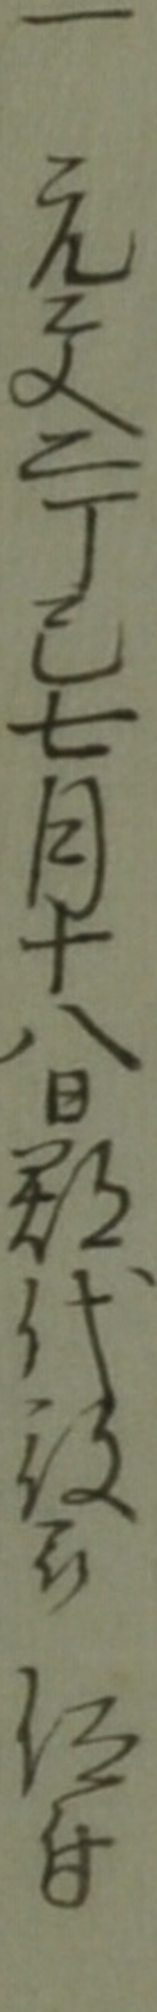一元文二丁巳七月十八日郡代役被仰付
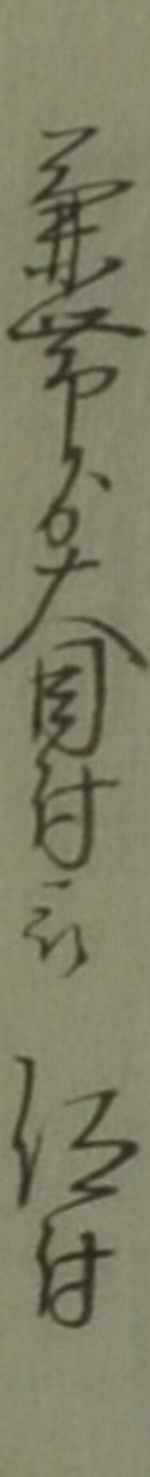兼帯ゟ大目付被仰付
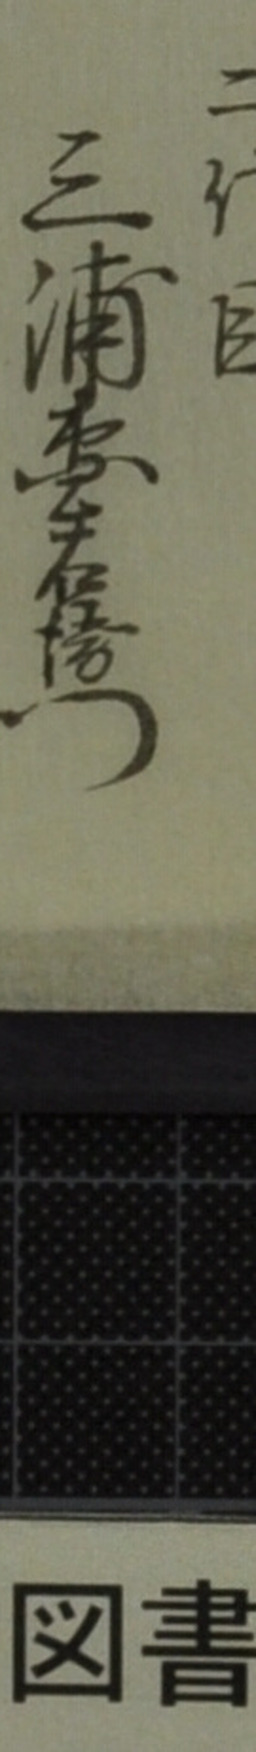三浦団右衛門
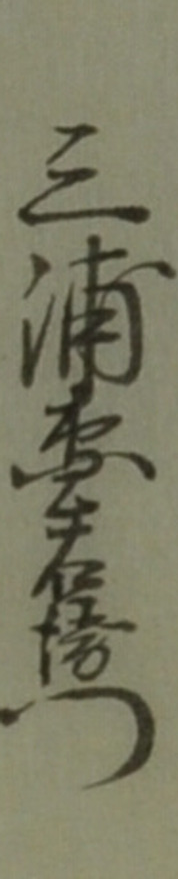三浦団右衛門
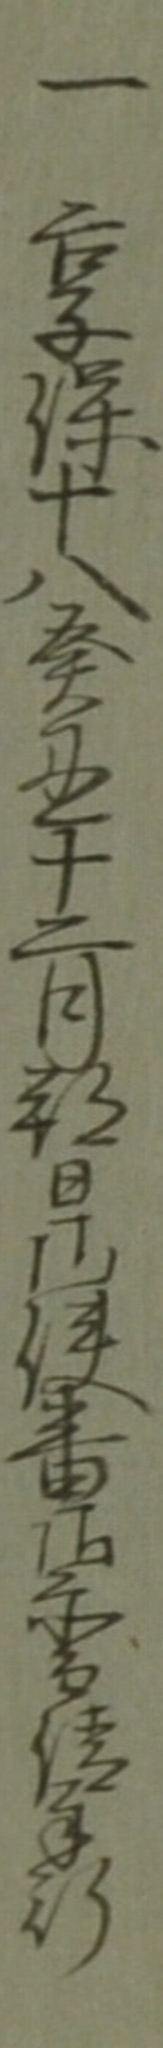一享保十八癸丑十二月朔日御使番御普請奉行
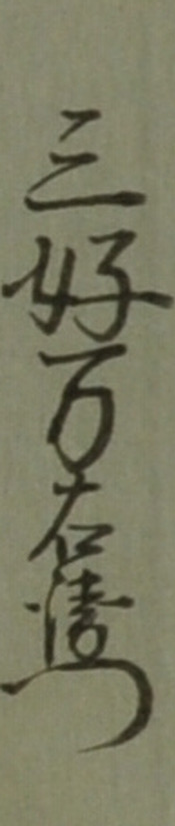三好万右衛門
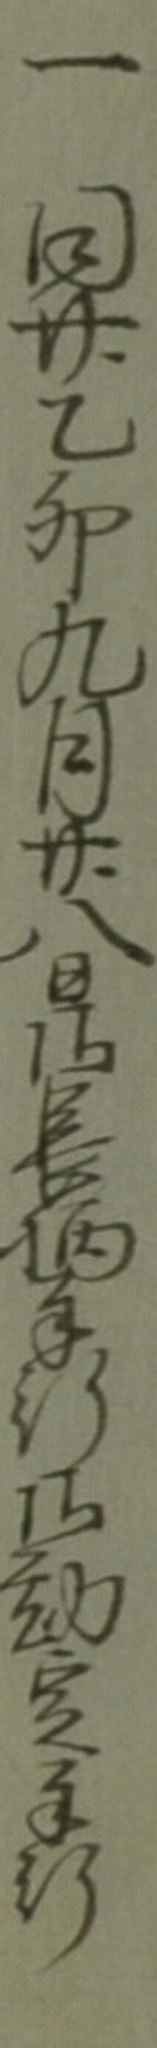一同廿乙卯九月廿八日御長柄奉行御勘定奉行
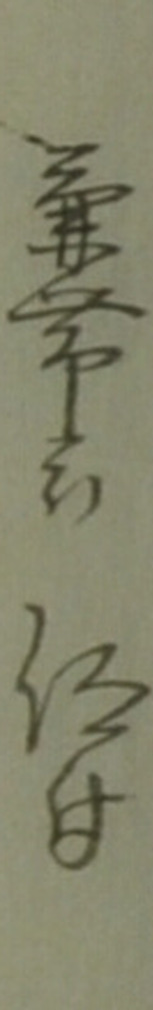兼帯被仰付
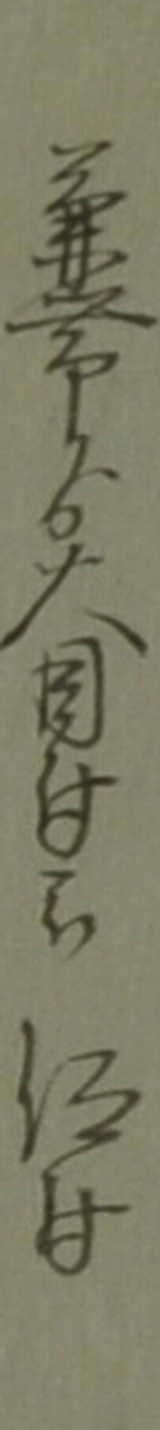兼帯ゟ大目付被仰付

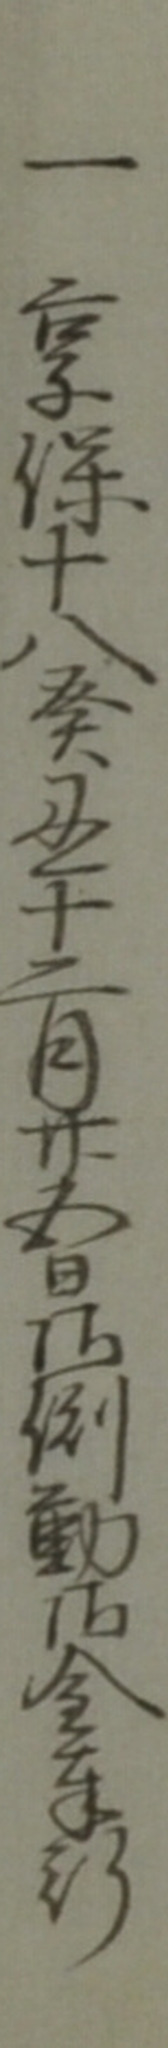一享保十八癸丑十二月廿五日御側勤御金奉行
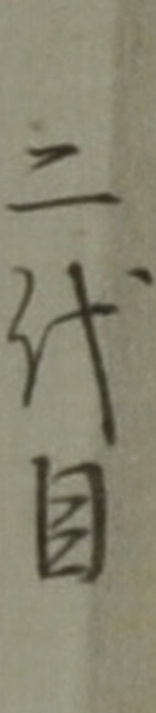二代目
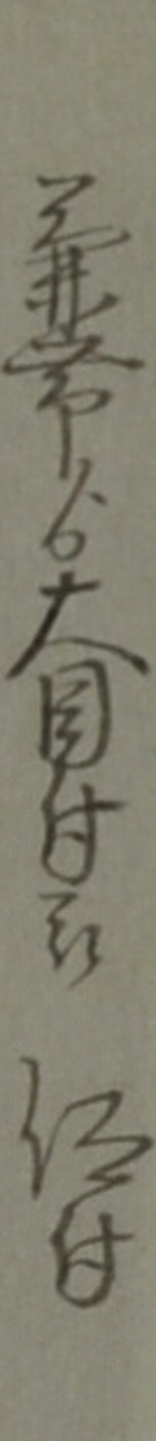兼帯ゟ大目付被仰付
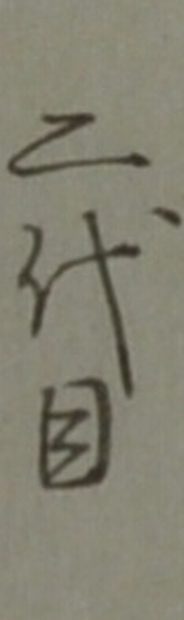二代目
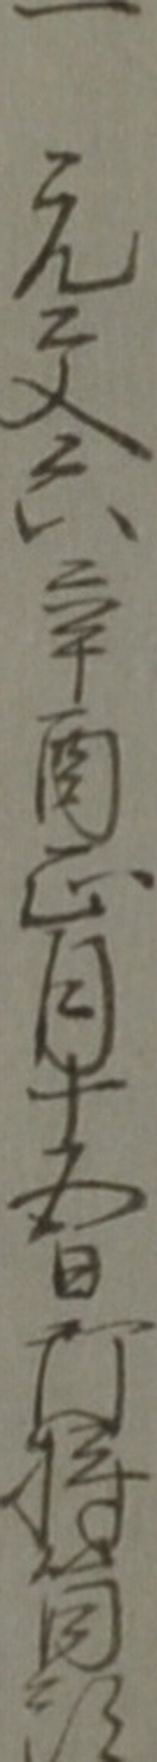一元文六辛酉正月十五日御持筒頭被
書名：諸御役代々録（三）
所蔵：伊那市立高遠町図書館・合同会社AMANE
